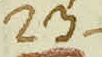23
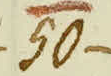50
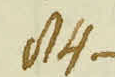84
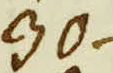30
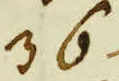36
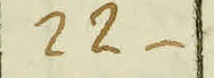22 -
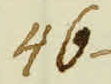46
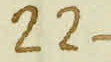22
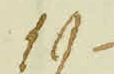19
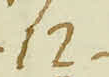12
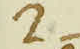2
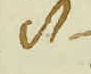8
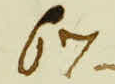67
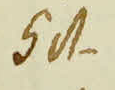58
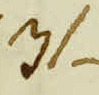31
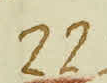22
